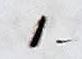1
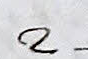2
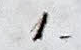1
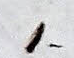1
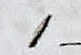1
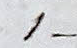1
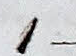1
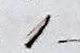1
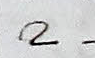2
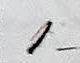1
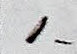1
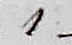1
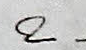2
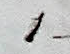1
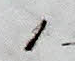1
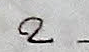2
